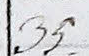35
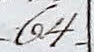64
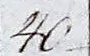40
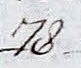78
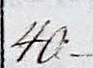40
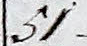51
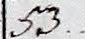53
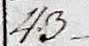43
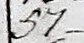57
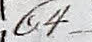64
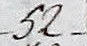52
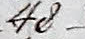48
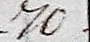70
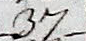37
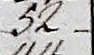52
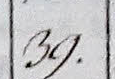39.
